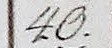40.
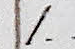1.
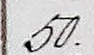50.
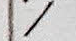1
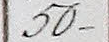50
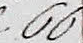66
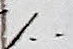1.
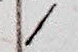1
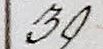39
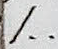1.
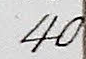40
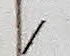1
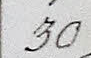30
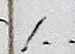1.
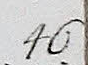46
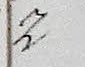2
